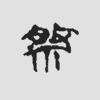祭
